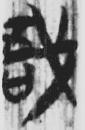○（禦）
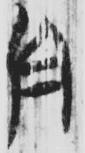於
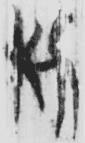朸
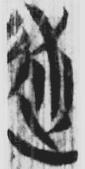述
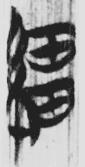{糸畕}（陳）
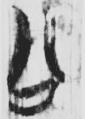公
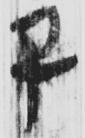子
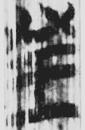皇
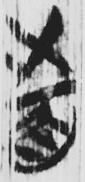{之頁}（戴-得）
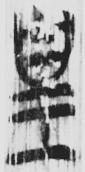皇
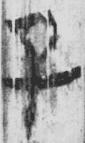子
